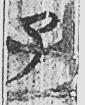子
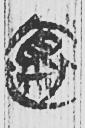褱
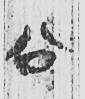公
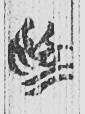爲
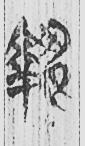執
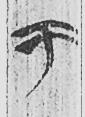于
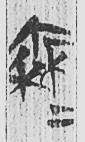秦=
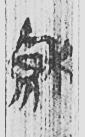穆
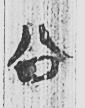公
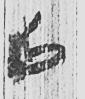㠯（以）
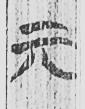亓
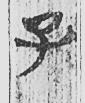子
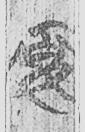妻
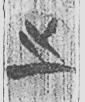之
